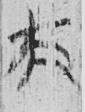夫
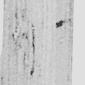子
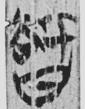智
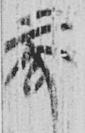而
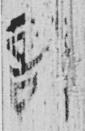信
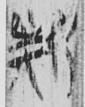斯
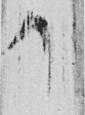人
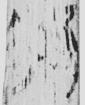欲
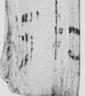亓（其）
